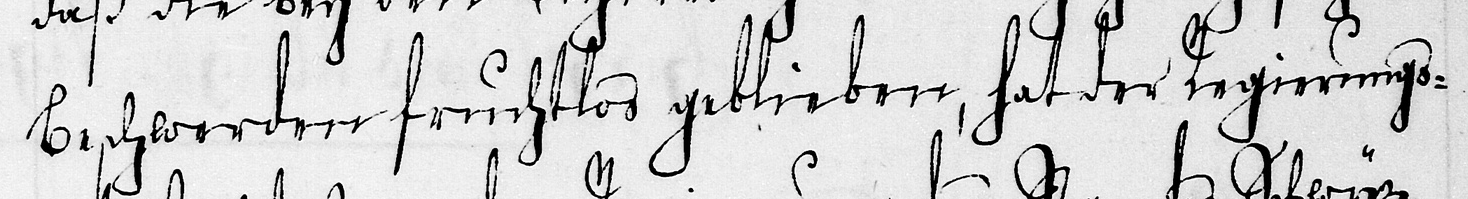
Beschwerden fruchtlos geblieben, hat der Regierungs¬
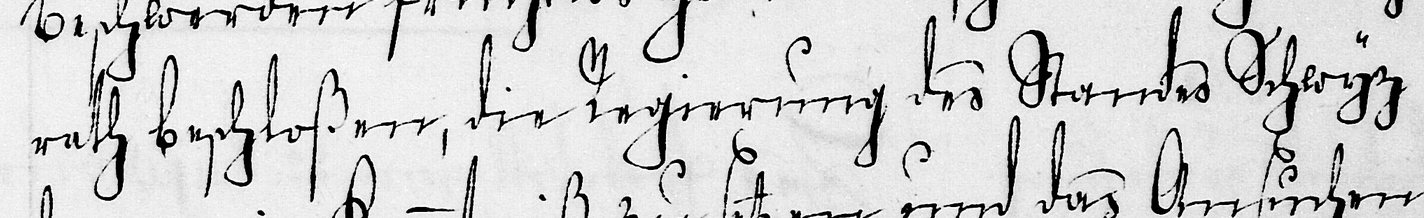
rath beschloßen, die Regierung des Standes Schwyz
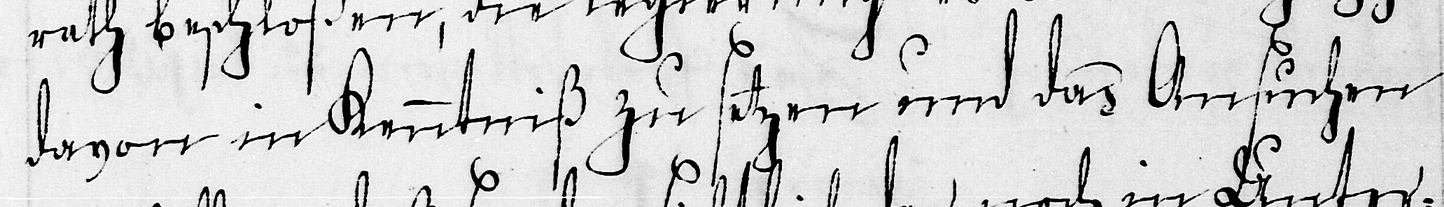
davon in Kenntniß zu setzen und das Ansuchen
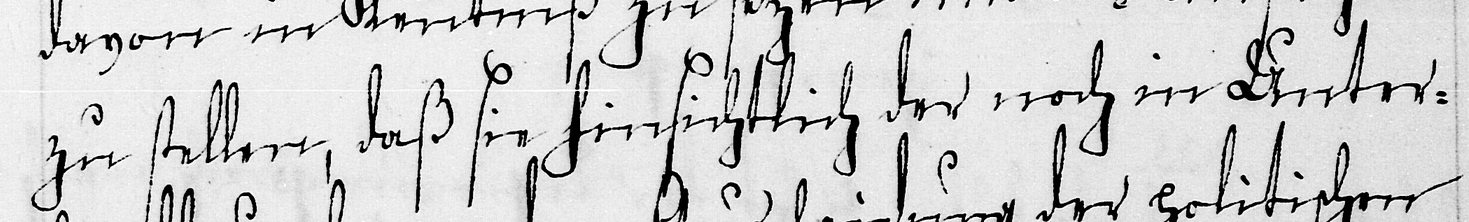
zu stellen, daß sie hinsichtlich der noch in Unter¬
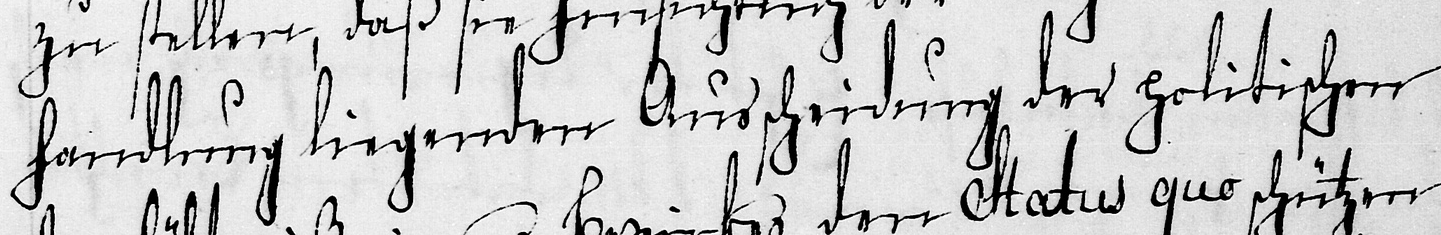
handlung liegenden Ausscheidung der politischen
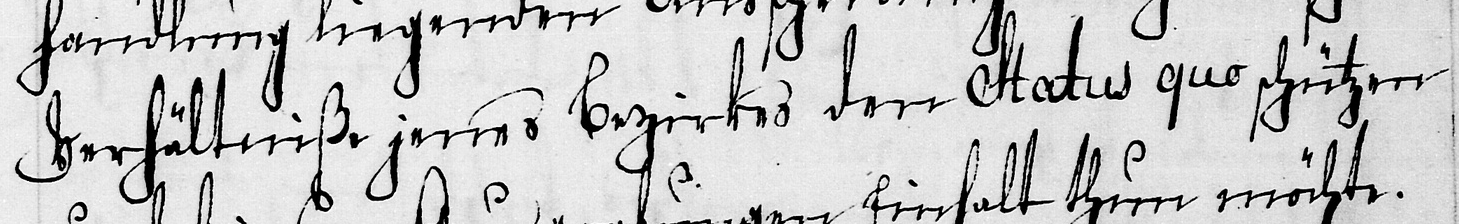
Verhältniße jenes Bezirkes den Status quo schützen
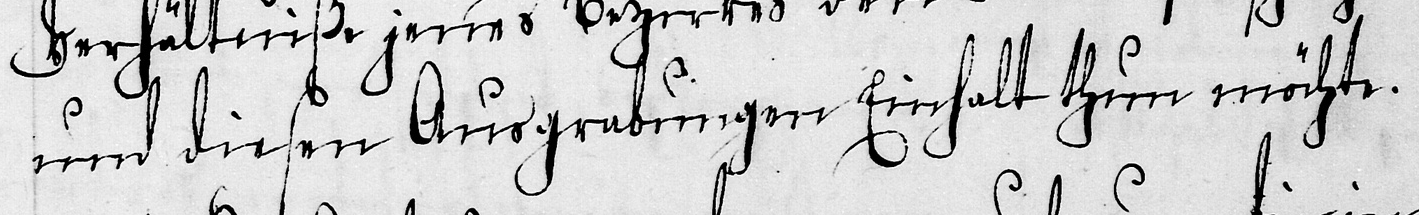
und diesen Ausgrabungen Einhalt thun möchte.
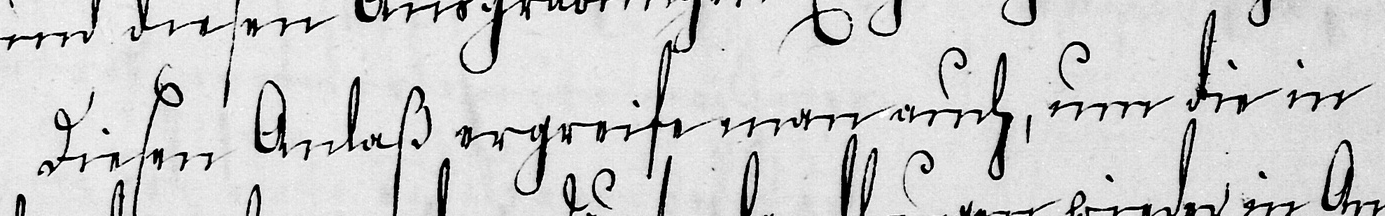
Diesen Anlaß ergreife man auch, um die in
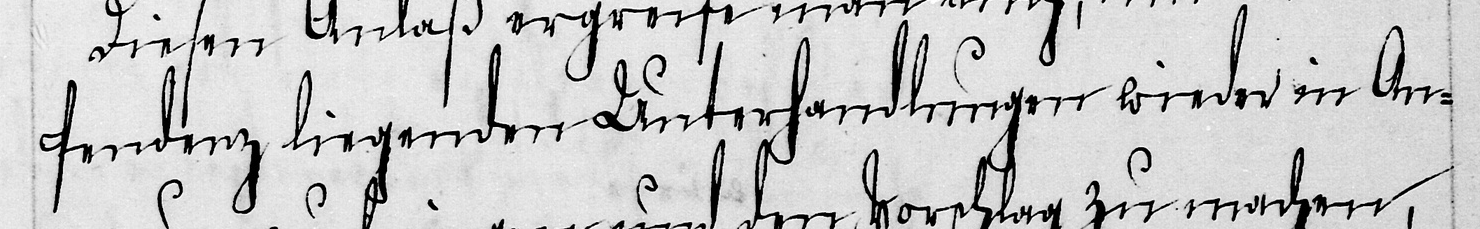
Pendenz liegenden Unterhandlungen wieder in An¬
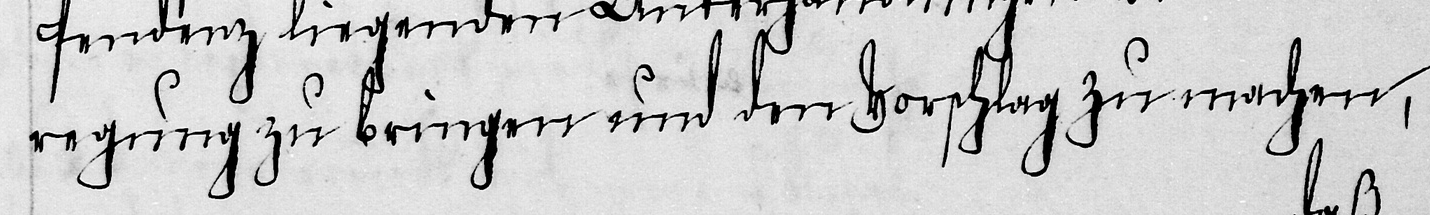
regung zu bringen und den Vorschlag zu machen
